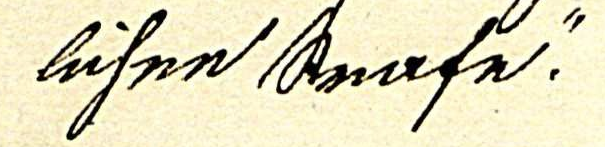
lichen Strafe.“
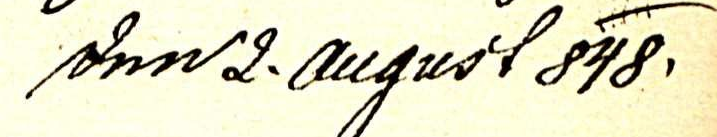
Den 2. August [1]848
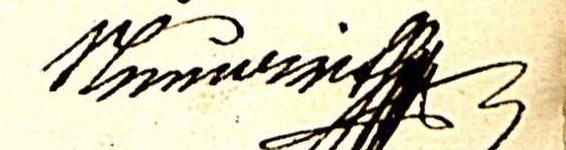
Neuwirth
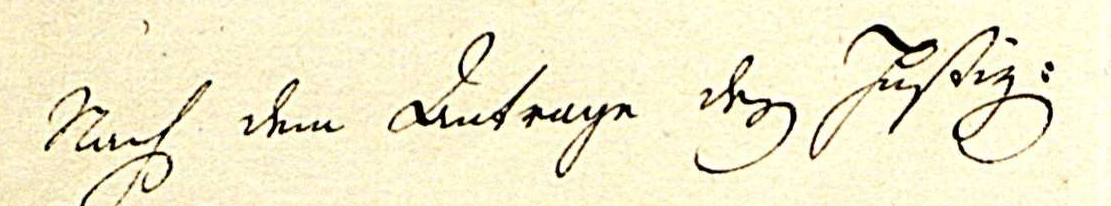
Nach dem Antrage des Justiz¬
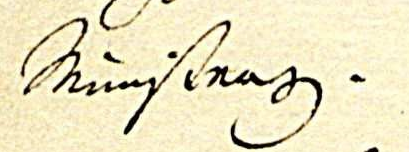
ministers.
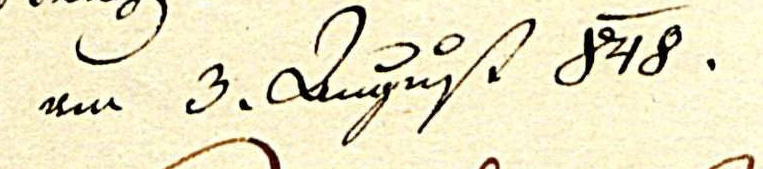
Am 3. August [1]848
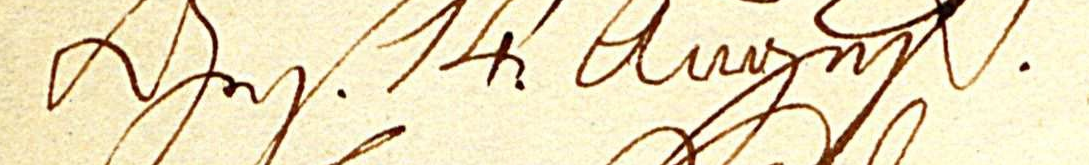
Ges. 14. August
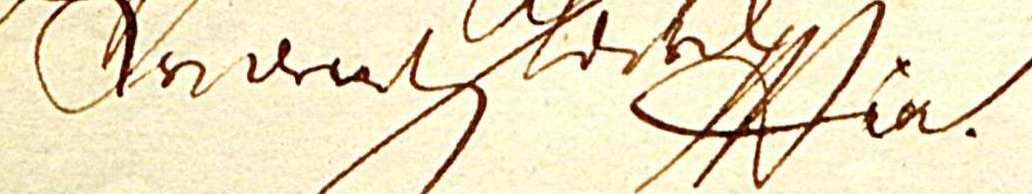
Franz Karl
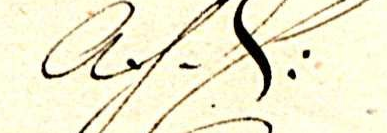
Ah E
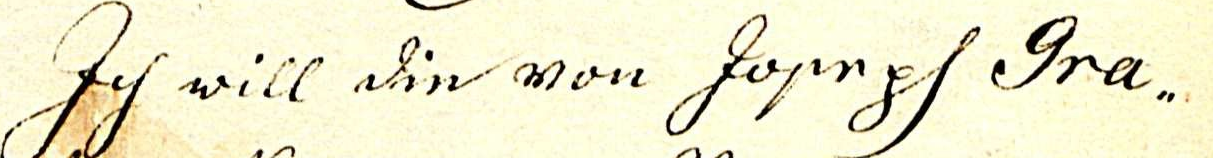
Ich will die von Joseph Gra¬
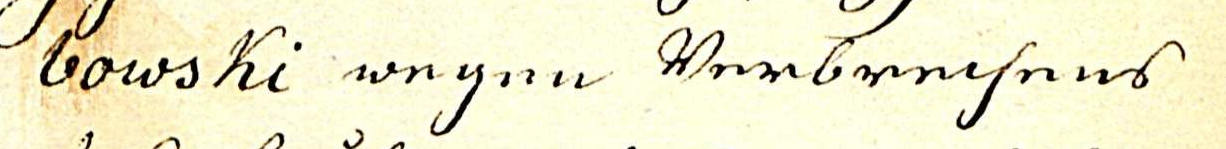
bowski wegen Verbrechens
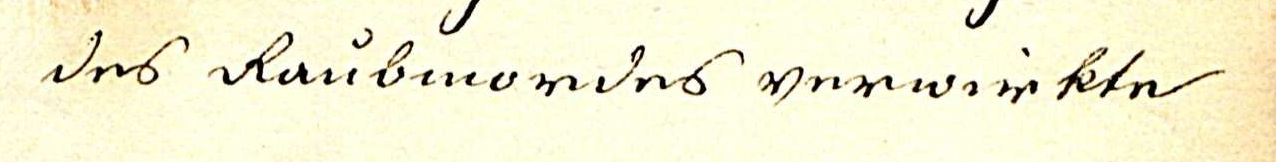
des Raubmordes verwirkte
